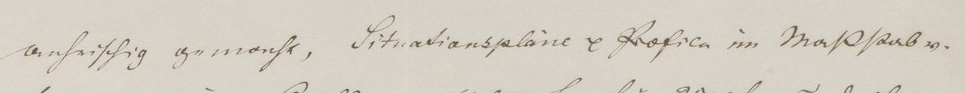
anheischig gemacht, Situationspläne & Profile im Maßstab v.
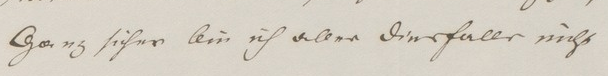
Ganz sicher bin ich aber diesfalls nicht.
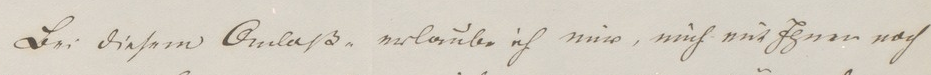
Sei diesem Anlaße erlaube ich mir, mich mit Ihnen noch
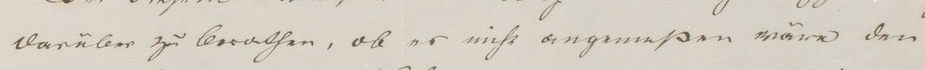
darüber zu berathen, ob es nicht angemeßen wäre den
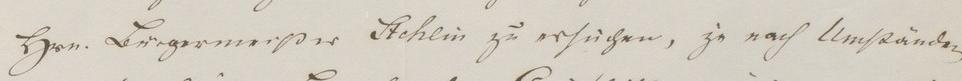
Hrn. Bürgermeister Stehlin zu ersuchen, je nach Umständen
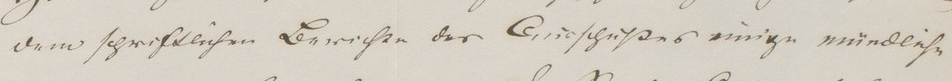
dem schriftlichen Berichte des Ausschußes einige mündliche
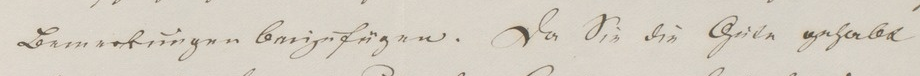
Bemerkungen beizufügen. Da Sie die Güte gehabt
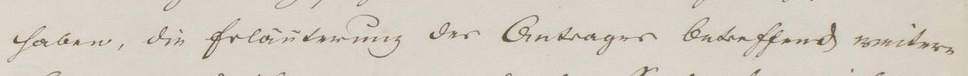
haben, die Erläuterung des Antrages betreffend weitere
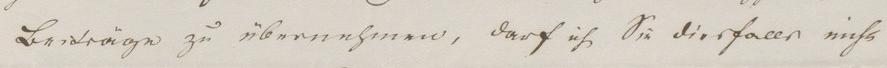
Beiträge zu übernehmen, darf ich Sie diesfalls nicht
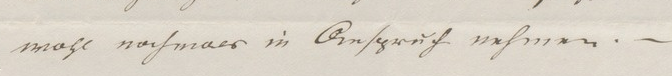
wohl nochmals in Anspruch nehmen. –
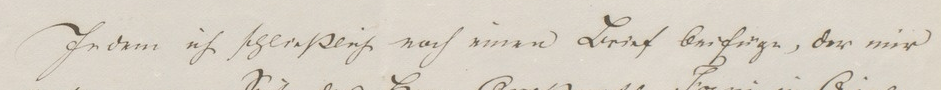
Indem ich schließlich noch einen Brief beifüge, der mir
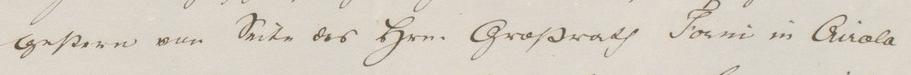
gestern von Seite des Hrn. Großrath Forni in Airolo
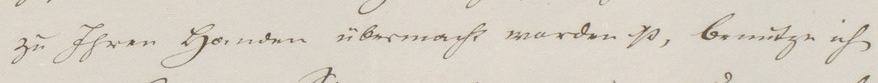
zu Ihren Handen übermacht werden ist, benutze ich
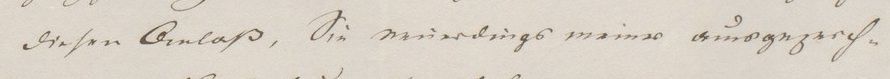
diesen Anlaß, Sie neuerdings meiner ausgezeich-
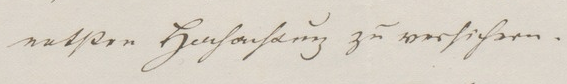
netsten Hochachtung zu versichern.
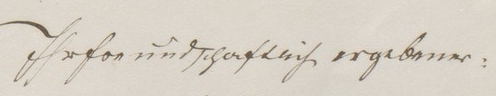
Ihr freundschaftlich ergebener:
